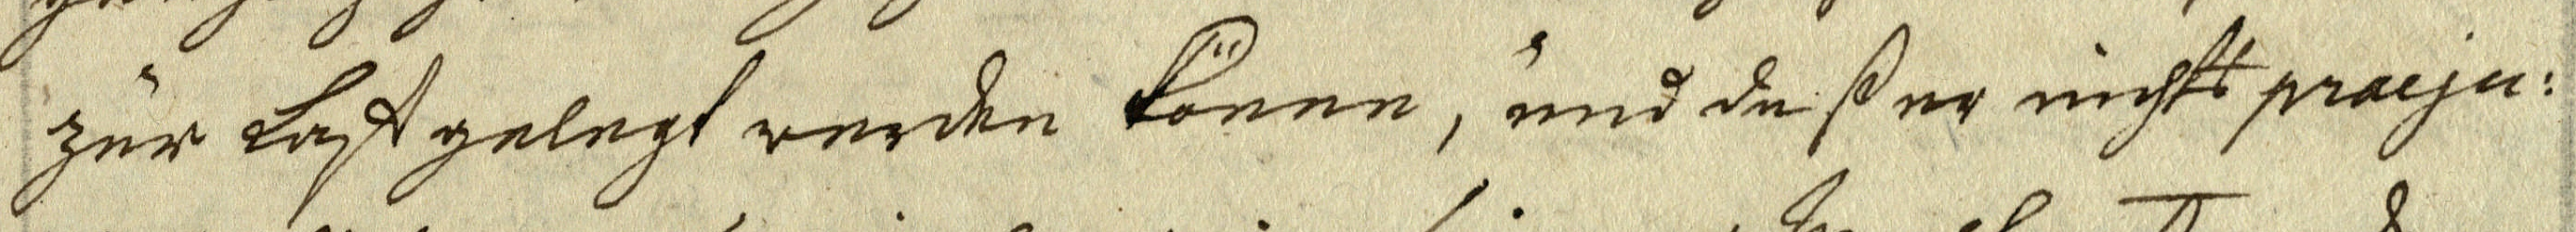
zur Last gelegt werden könne, und daß er nichts praeju¬
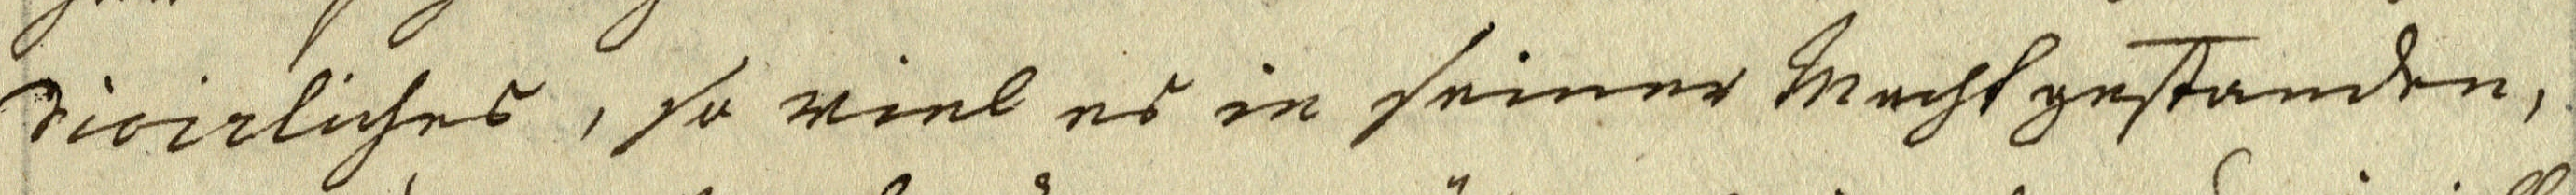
dicirliches, so viel es in seiner Macht gestanden,
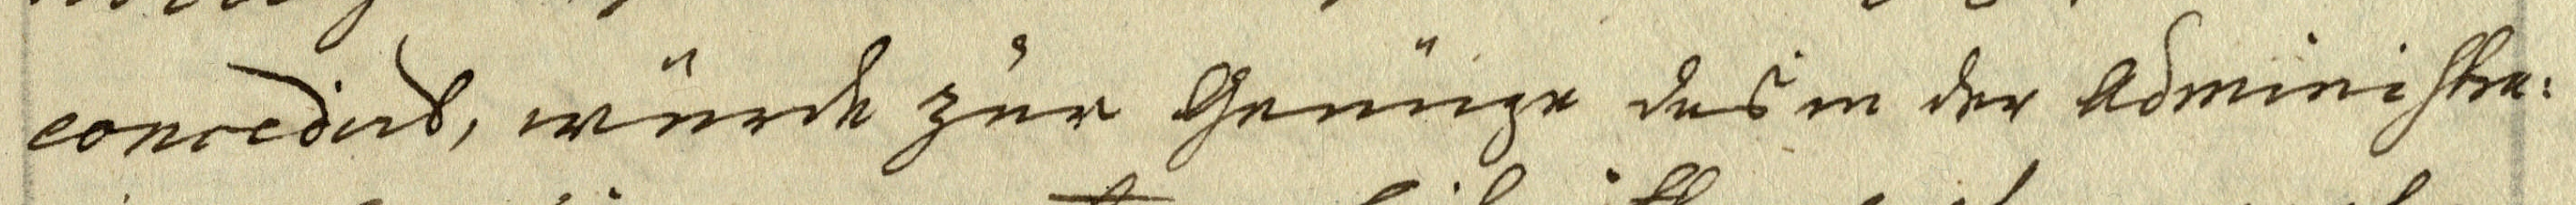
concedirt, würde zur Genüge das in der Administra¬
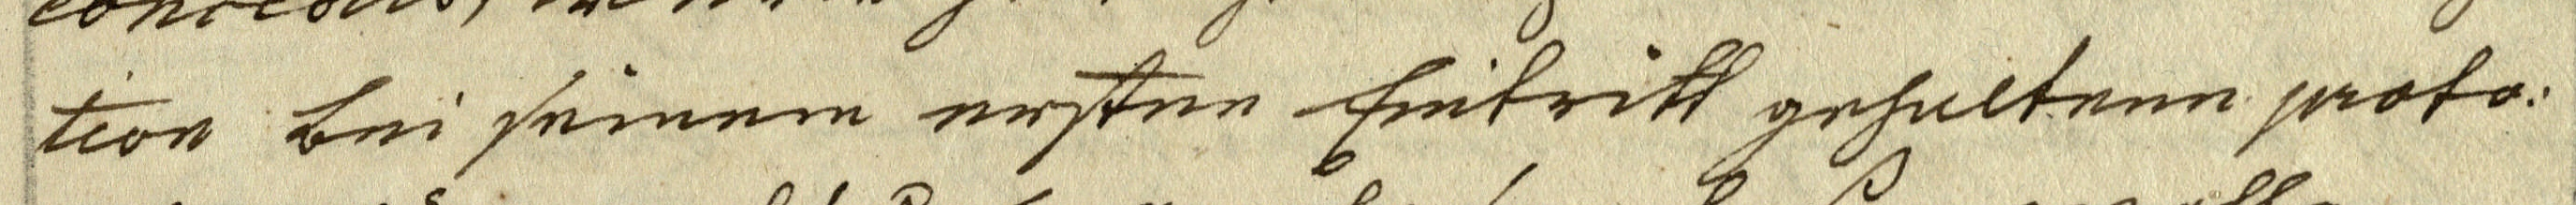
tion bei seinem ersten Eintritt gehaltene proto¬
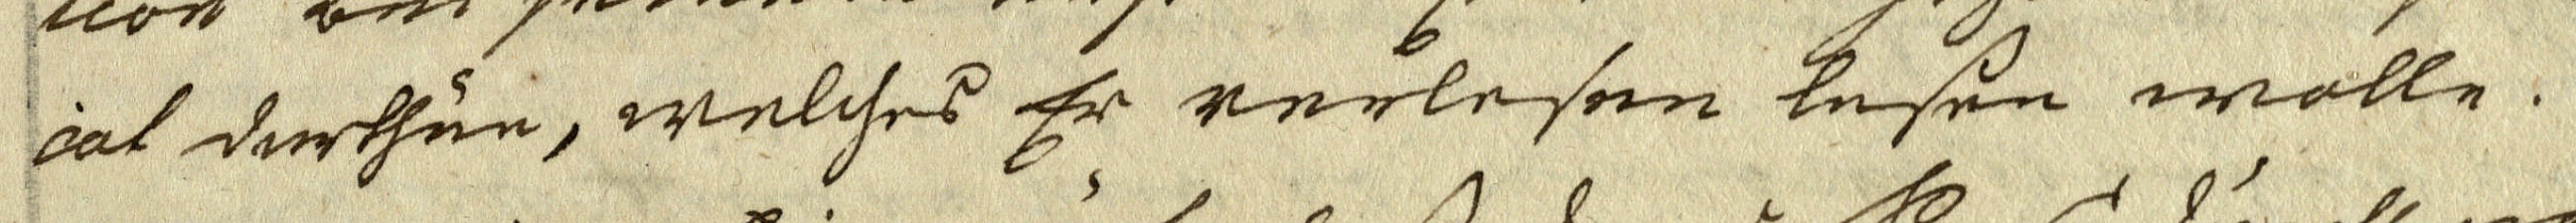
col darthun, welches Er verlesen laßen wolle.
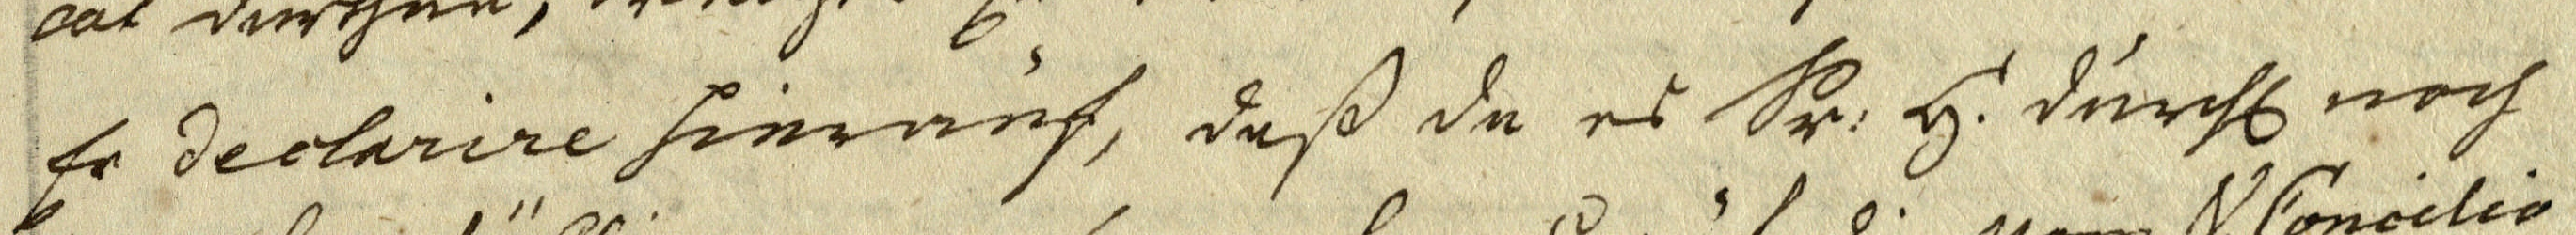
Er declarire hierauf, daß da es Sr H. Durchl. noch
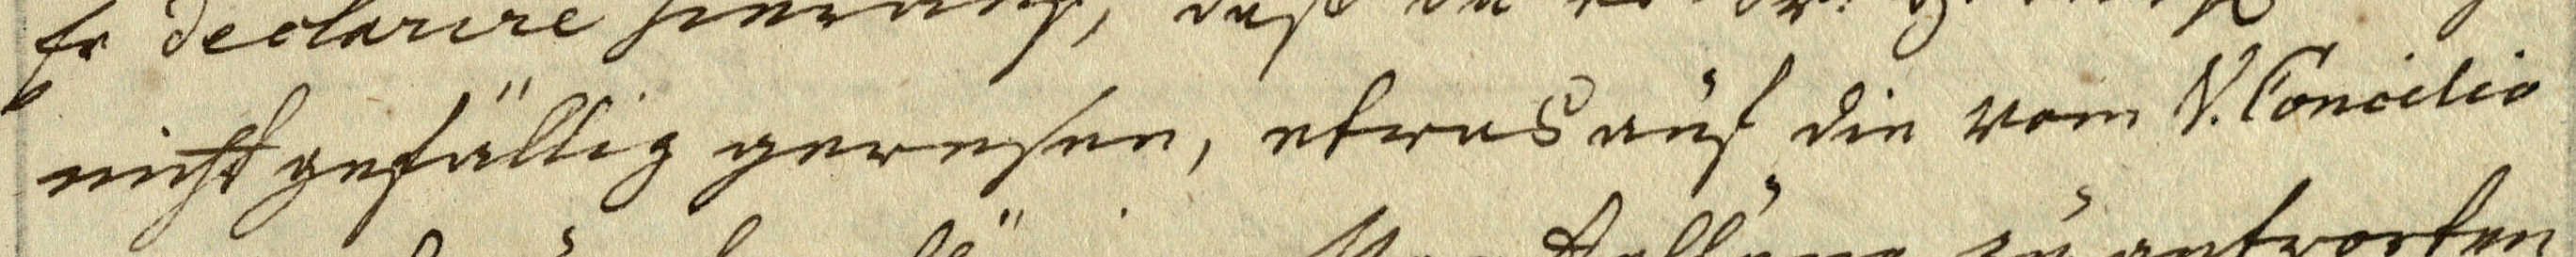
nicht gefällig gewesen, etwas auf die vom V. Concilio
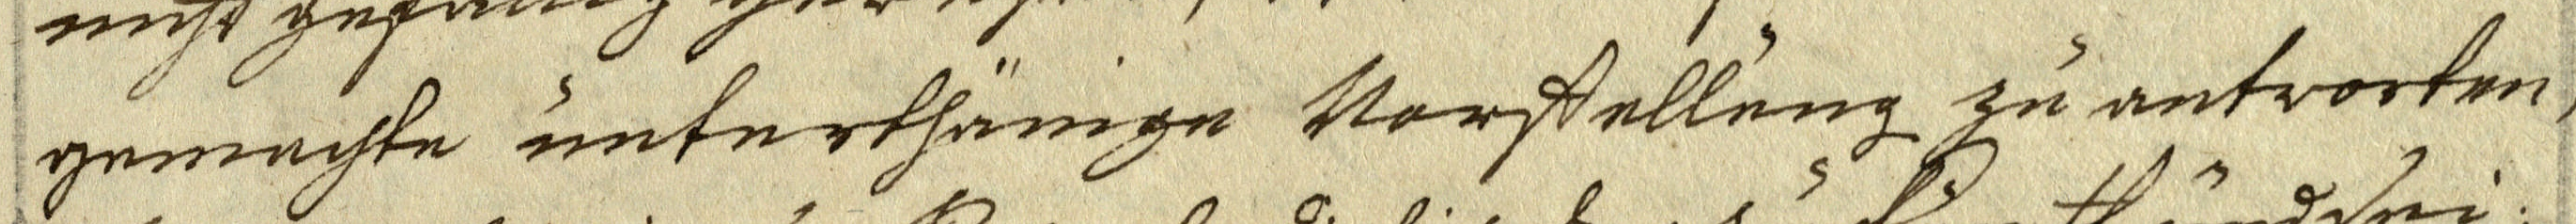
gemachte unterthänige Vorstellung zu antworten,
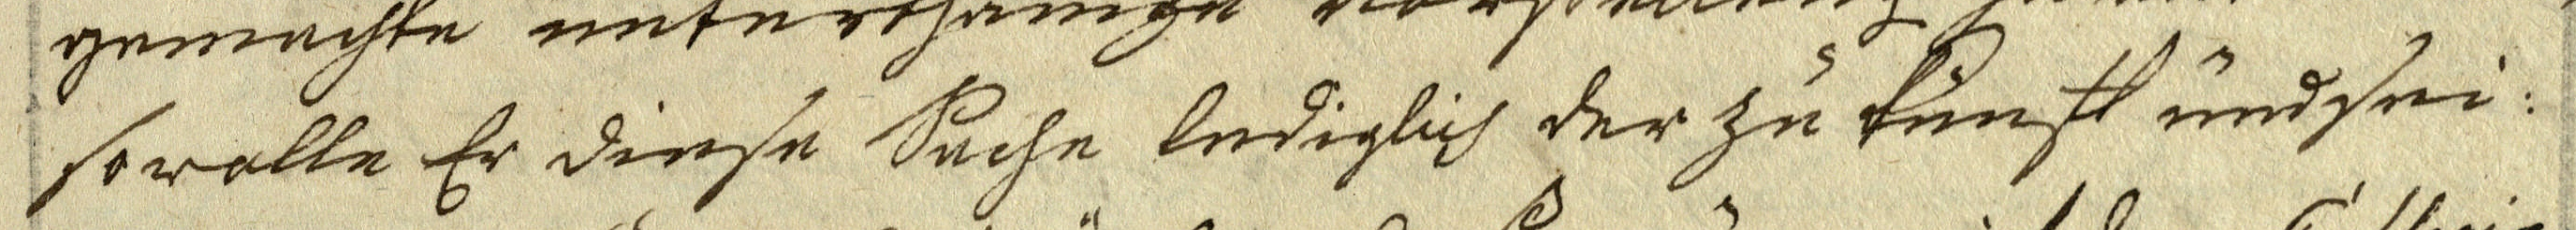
so wolle Er diese Sache lediglich der Zukunft und sei¬
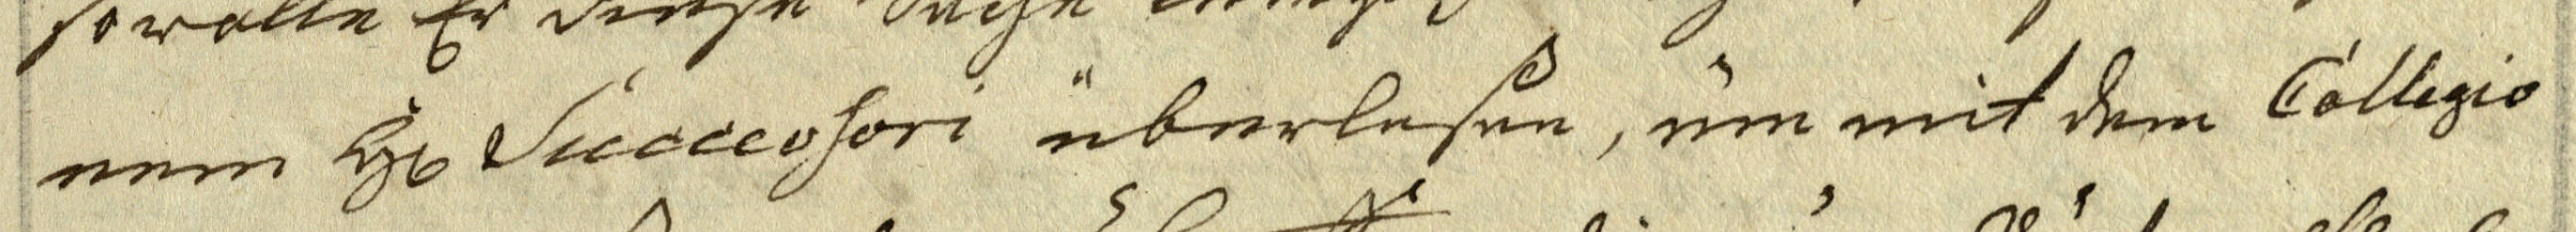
nem h.Successori überlaßen, um mit dem Collegio
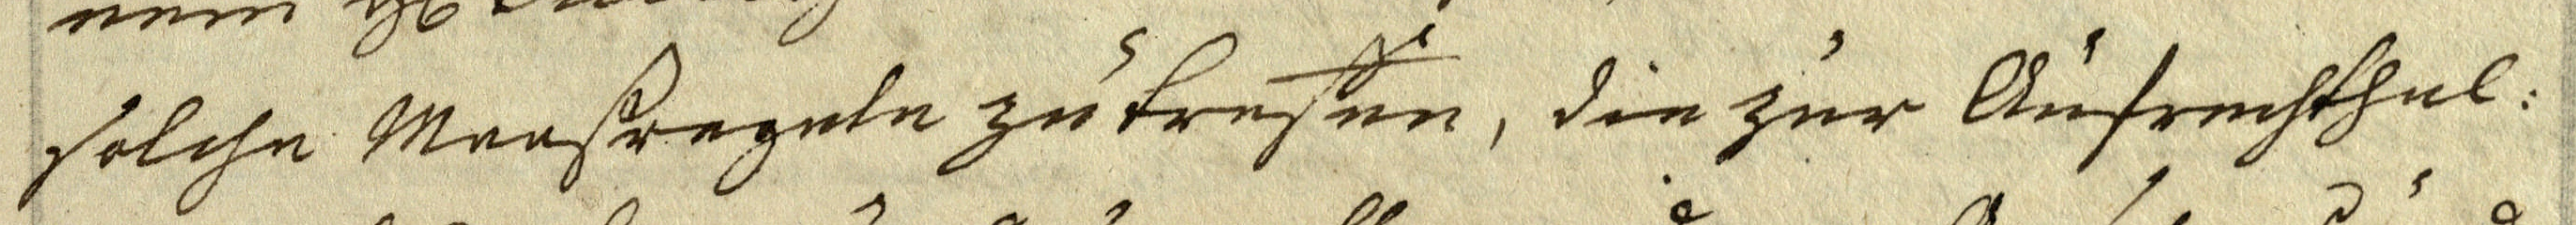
solche Maaßregeln zu treffen, die zur Aufrechthal¬
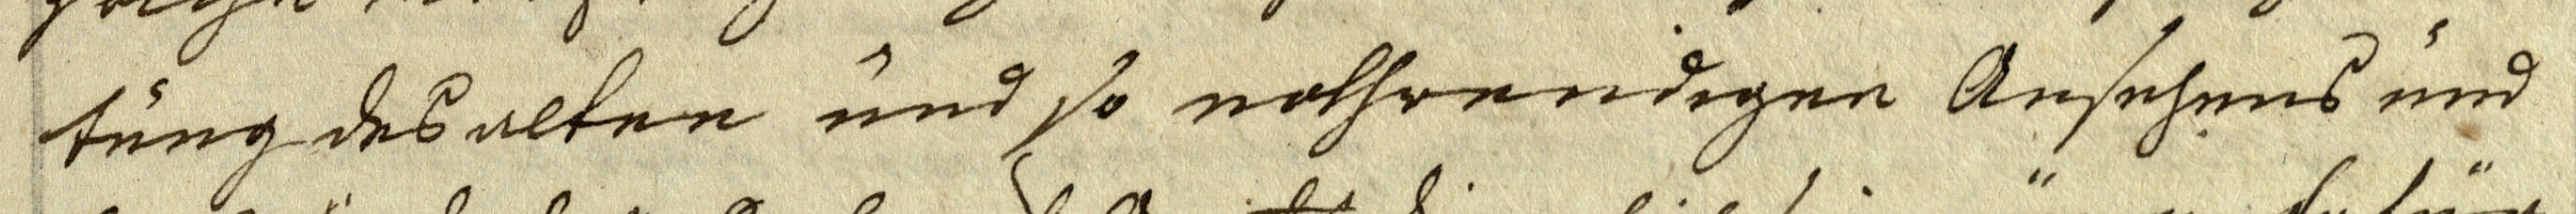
tung des alten und so nothwendigen Ansehens und
